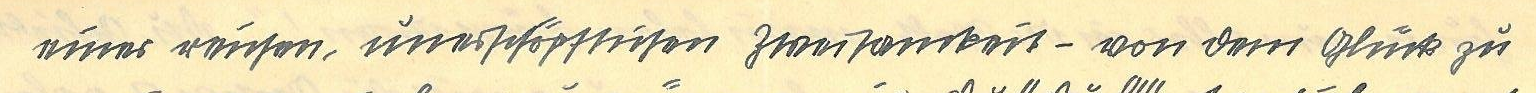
einer reichen, unerschöpflichen Zweisamkeit – von dem Glück zu
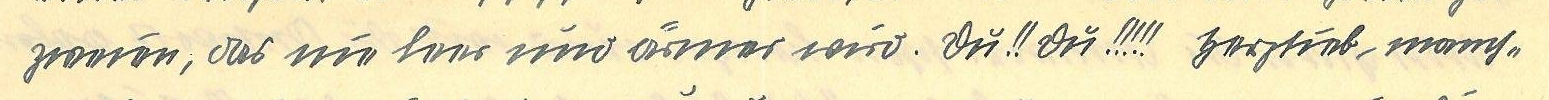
zweien, das nie leer und ärmer wird. Du!! Du!!!!! Herzlieb, manch¬
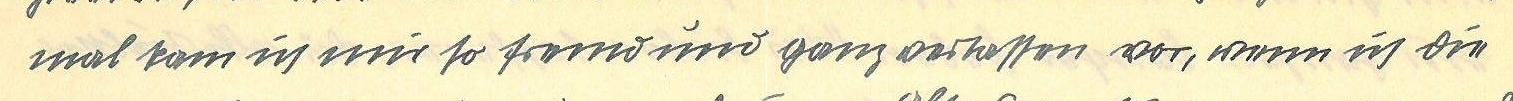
mal kam ich mir so fremd und ganz verlassen vor, wenn ich die
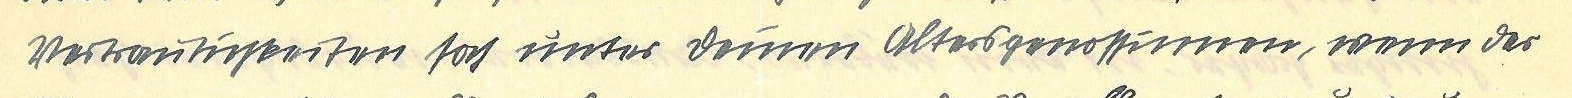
Vertraulichkeit sah unter Deinen Altersgenossinnen, wenn der
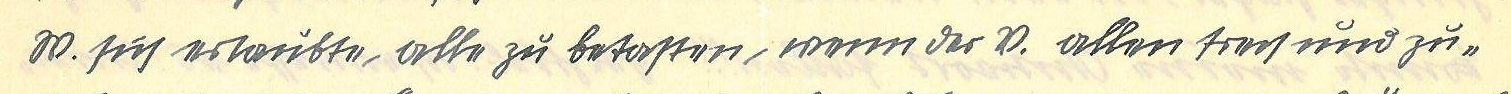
W. sich erlaubte, alle zu betasten, wenn der W. allen frech und zu¬
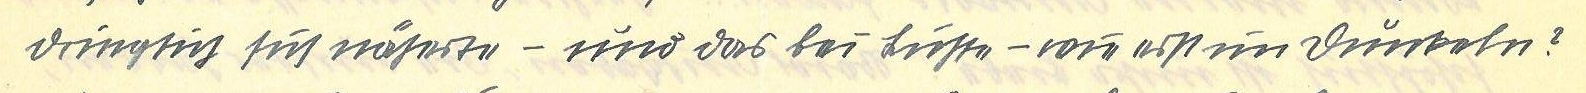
dringlich sich näherte – und das bei Lichte – wie erst im Dunkeln?
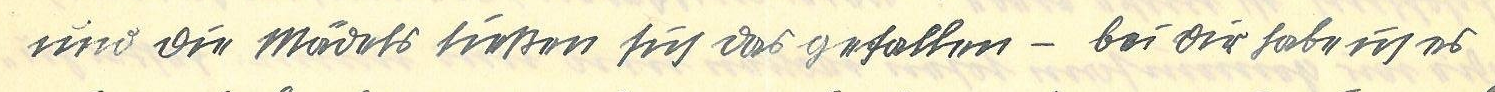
und die Mädels ließen sich das gefallen – bei Dir habe ich es
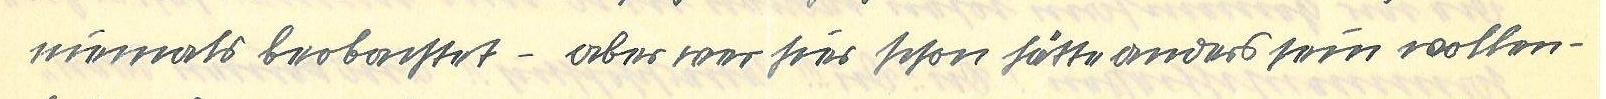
niemals beobachtet – aber wer hier schon hätte anders sein wollen –
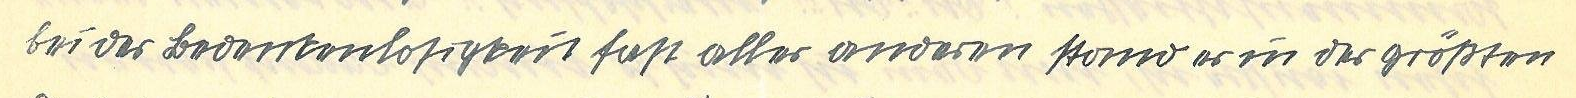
bei der Bedenkenlosigkeit fast aller anderen stand er in der größten
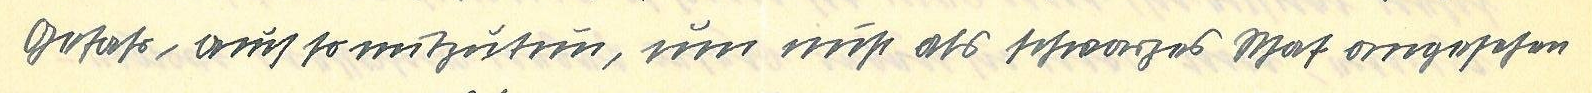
Gefahr, auch so mitzutun, um nicht als schwarzes Schaf angesehen
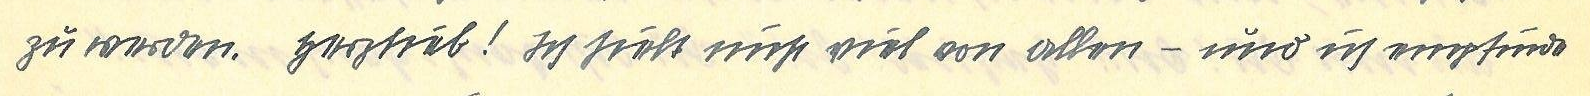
zu werden. Herzlieb! Ich hielt nicht viel von allen – und ich empfinde
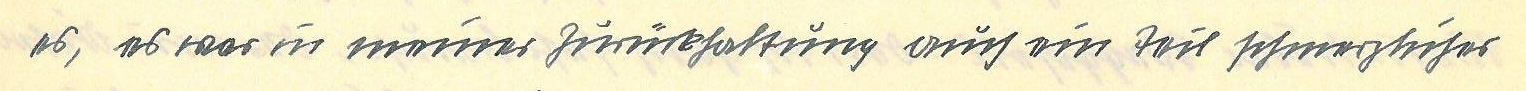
es, es war in meiner Zurückhaltung auch ein Teil schmerzlicher
